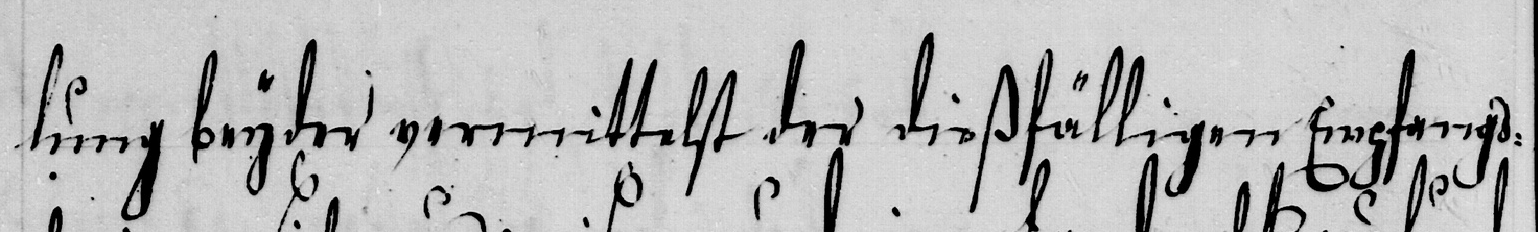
lung beyder vermittelst der dießfälligen Empfangs¬
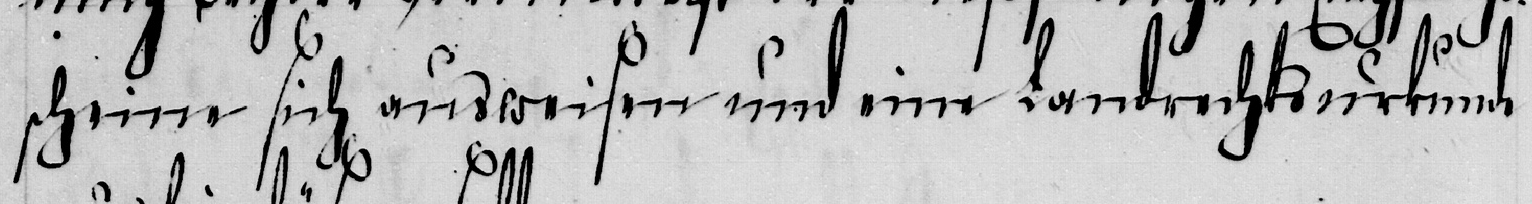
scheine sich ausweisen und eine Landrechtsurkunde
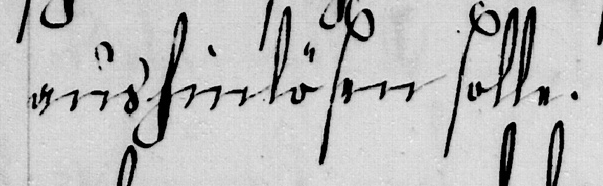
aushinlösen solle.
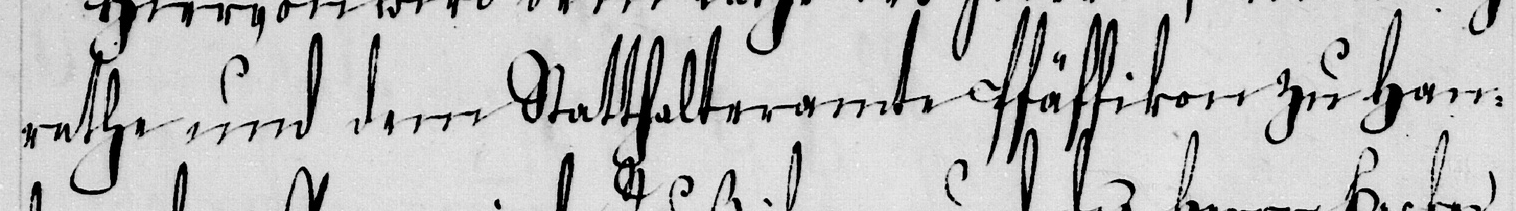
rathe und dem Statthalteramte Pfäffikon zu Han¬
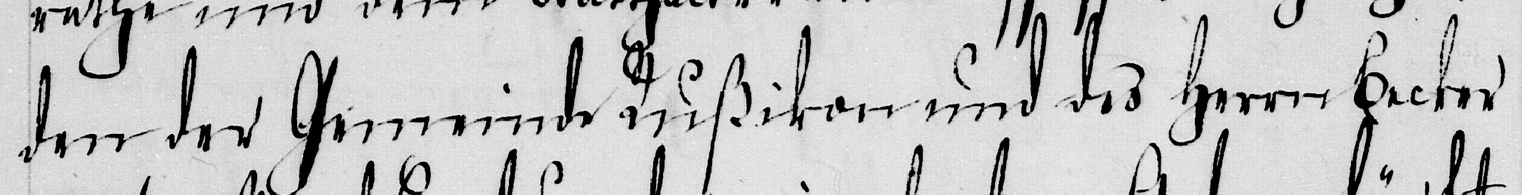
den der Gemeinde Rußikon und des Herrn Becker
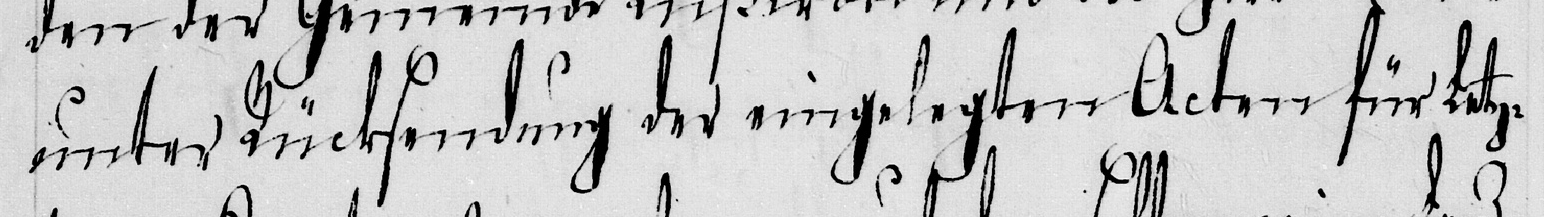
unter Rücksendung der eingelegten Acten für Let¬
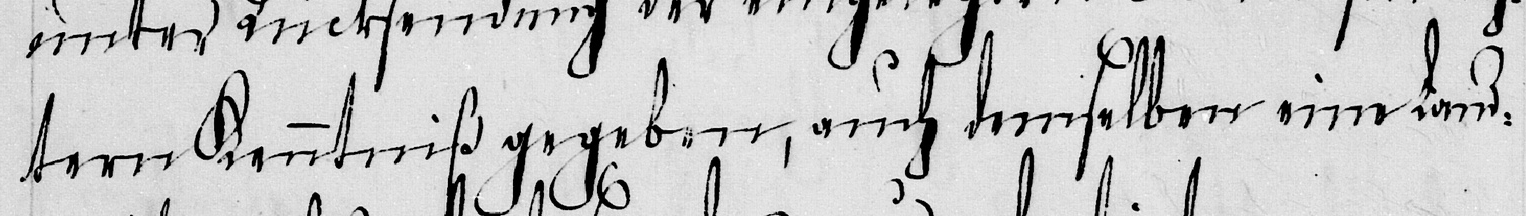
ztern Kenntniß gegeben, auch demselben eine Land¬
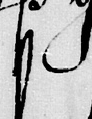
Ge¬
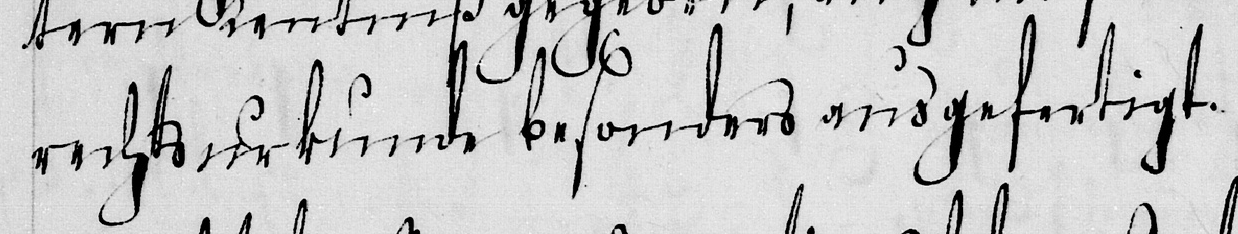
rechtsurkunde besonders ausgefertigt.
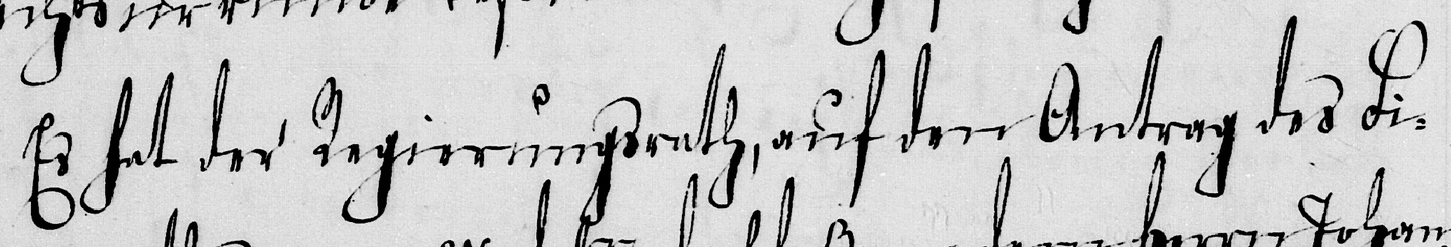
Es hat der Regierungsrath, auf den Antrag des Fi¬
